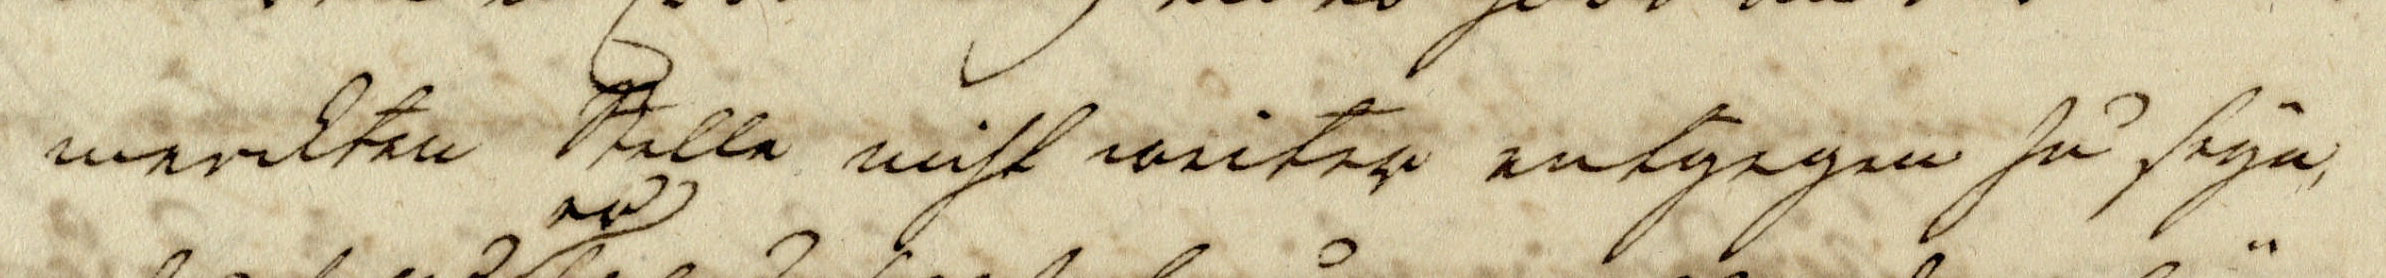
merckten Stelle nicht weiter entgegen zu seÿn,
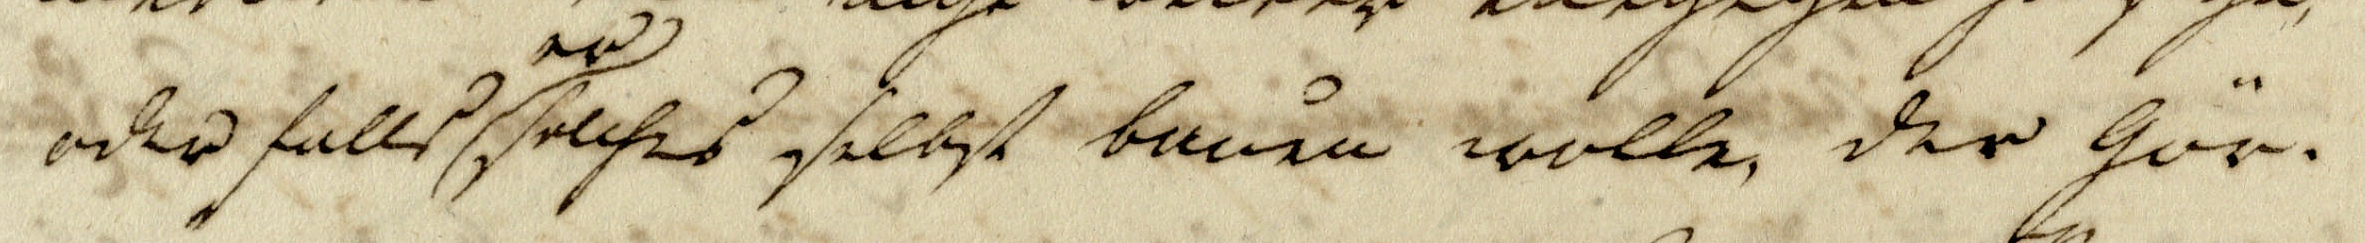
oder falls er solches selbst bauen wolle, der Gör¬
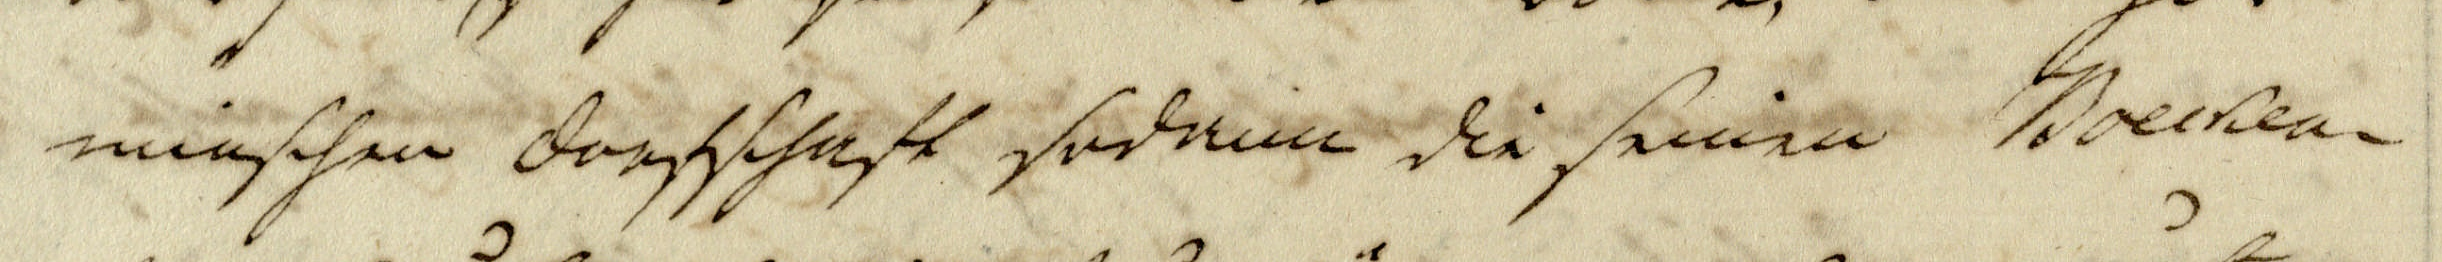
minschen Dorfschaft sodann die seinen Boecken¬
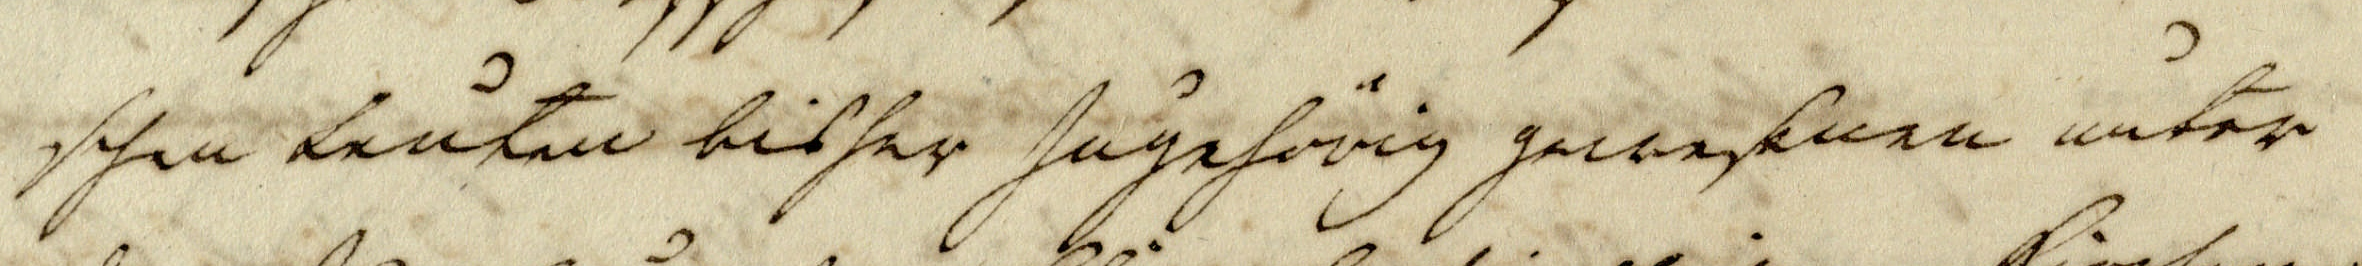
schen Leuten bisher zugehörig gewesenen unter
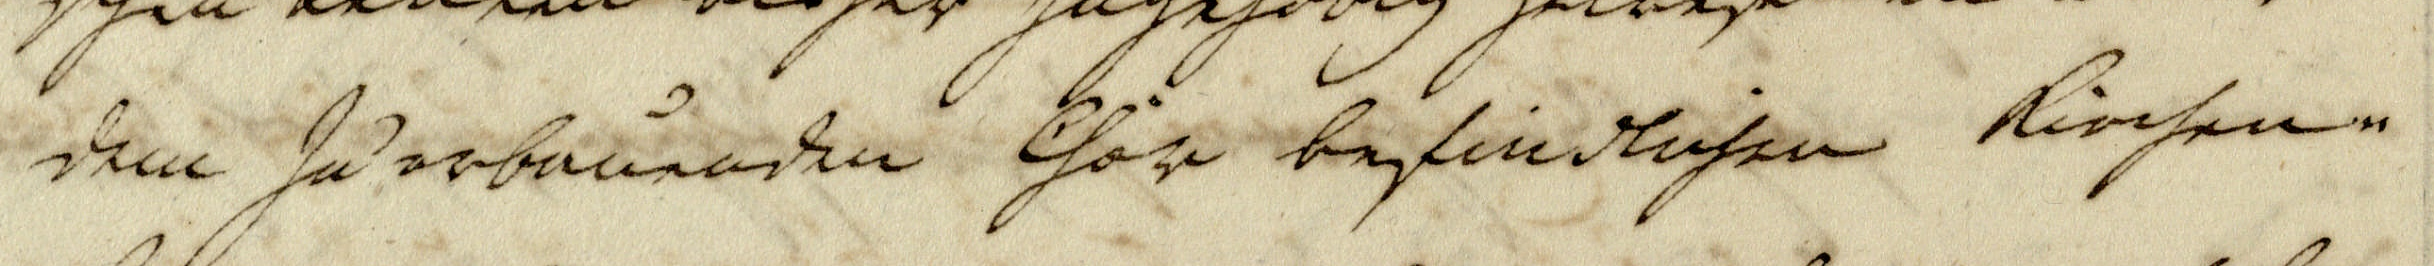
dem zu erbauenden Chor befindlichen Kichen¬
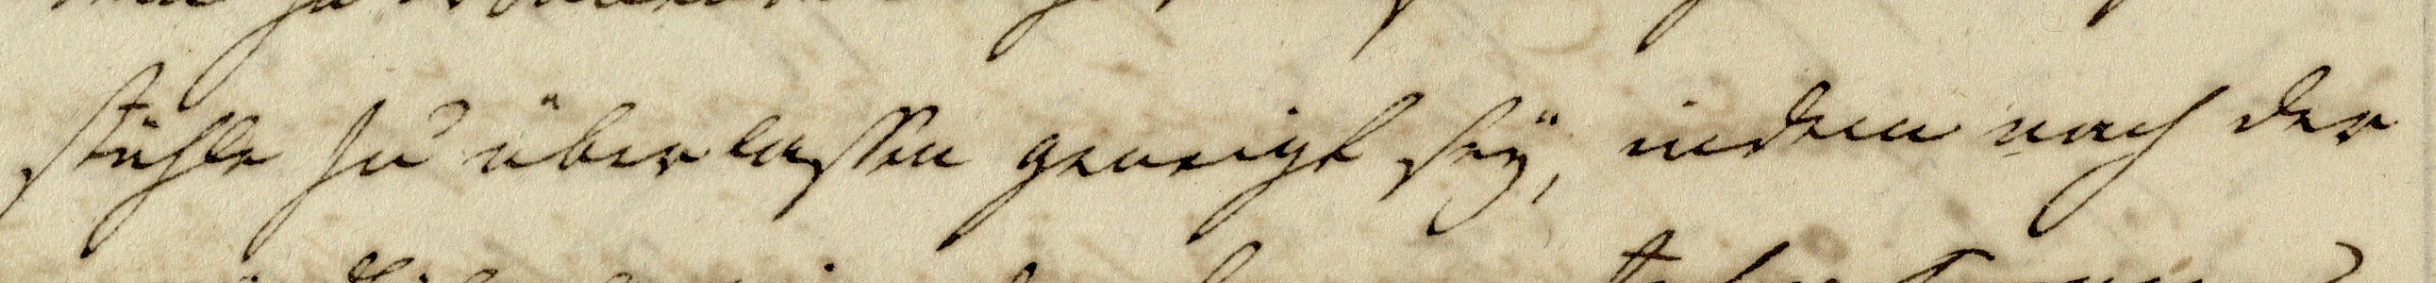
stühle zu überlassen geneigt seÿ, indem nach der
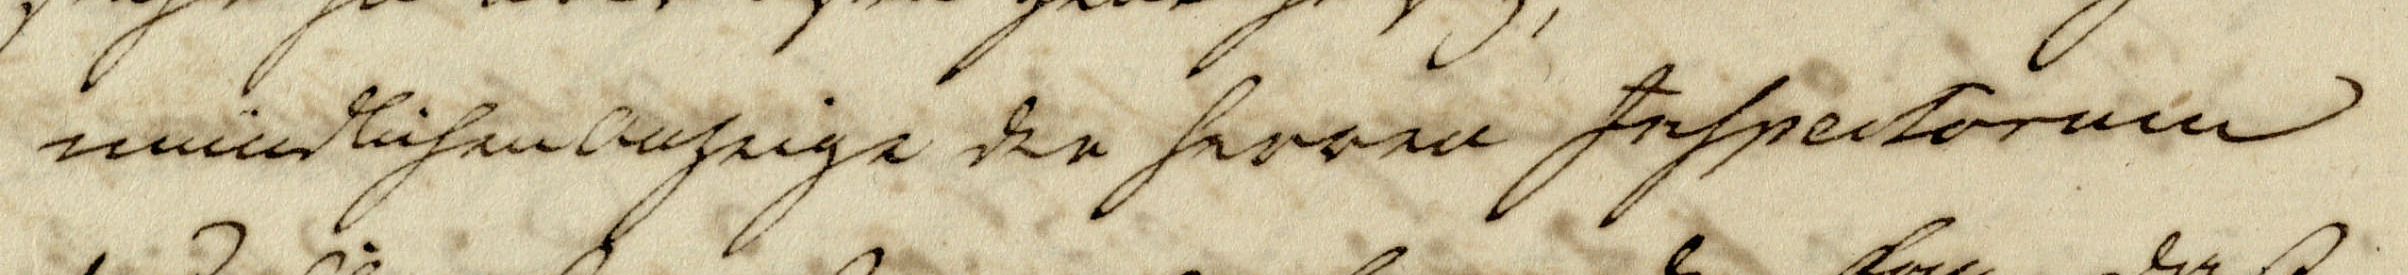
mündlichen Anzeige der Herren Inspectorum
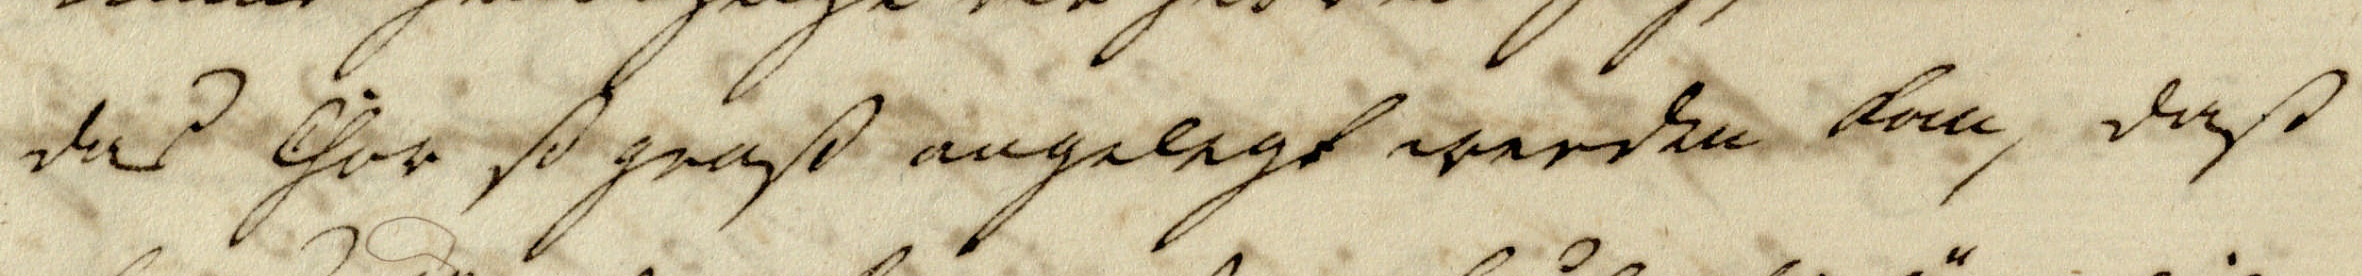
das Chor so groß angelegt werden kan, daß
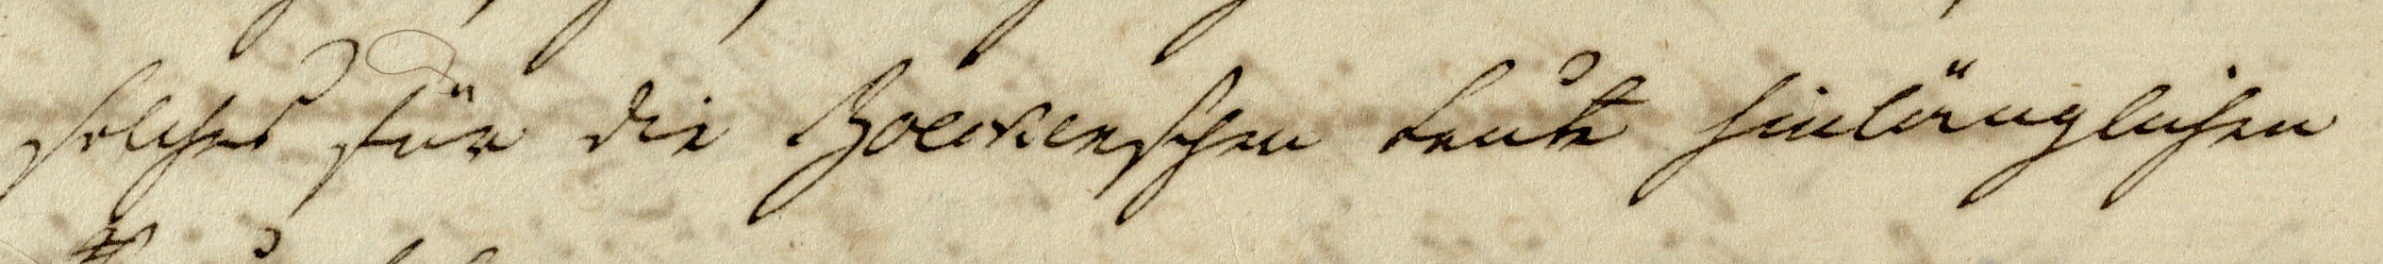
solches für die Boeckenschen Leute hinlänglichen
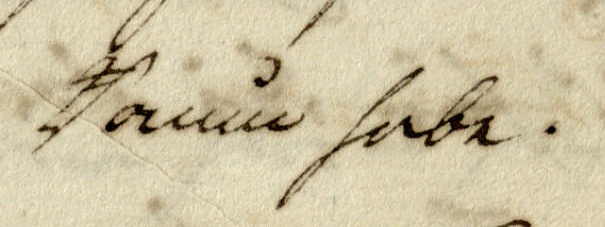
Raum habe.
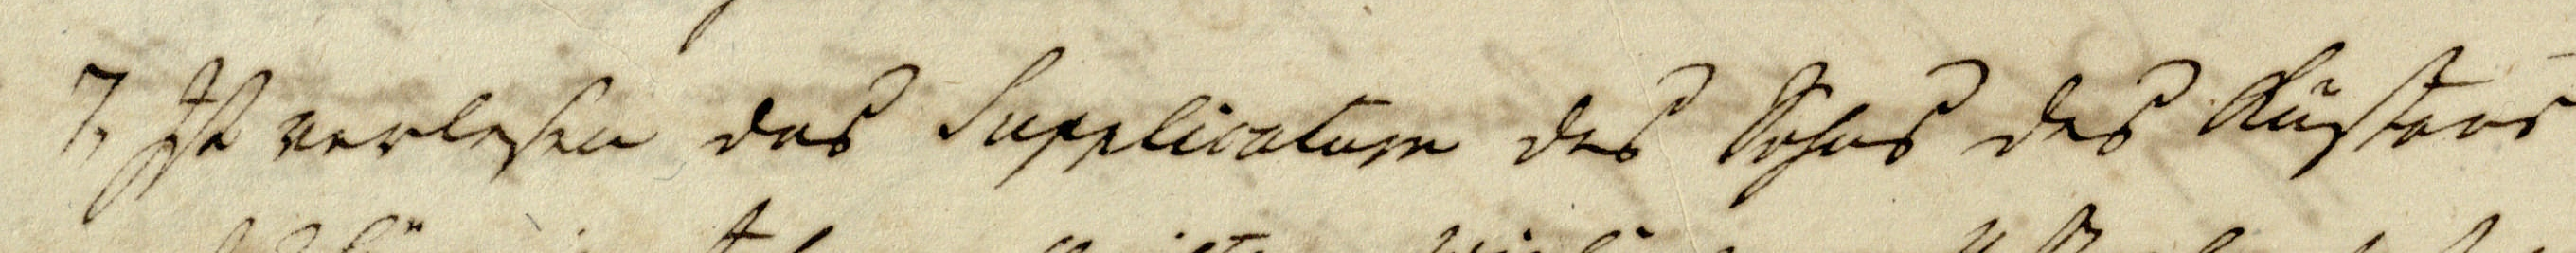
7. Ist verlesen das Supplicatum des Sohns des Küsters
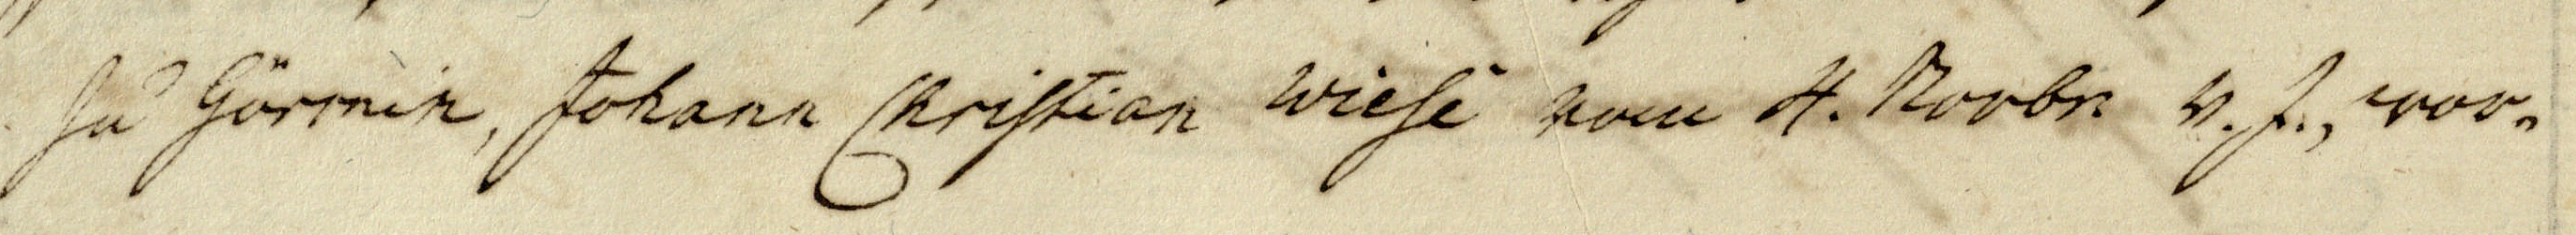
zu Görmin, Johann Christian Wiese vom 4. Novbr. v. J. wor¬
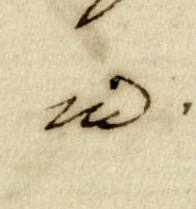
in
